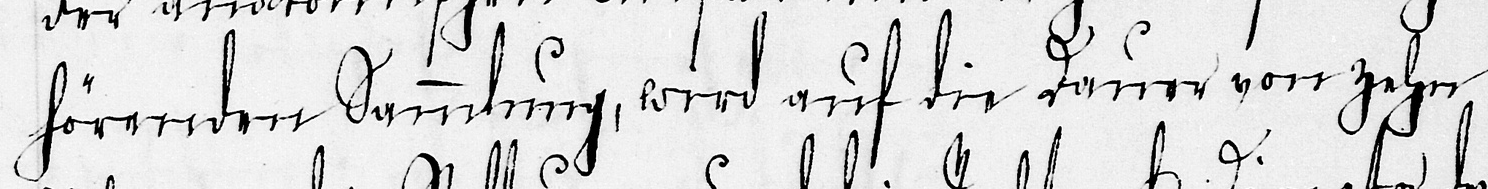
hörenden Sammlung, wird auf die Dauer von zehn
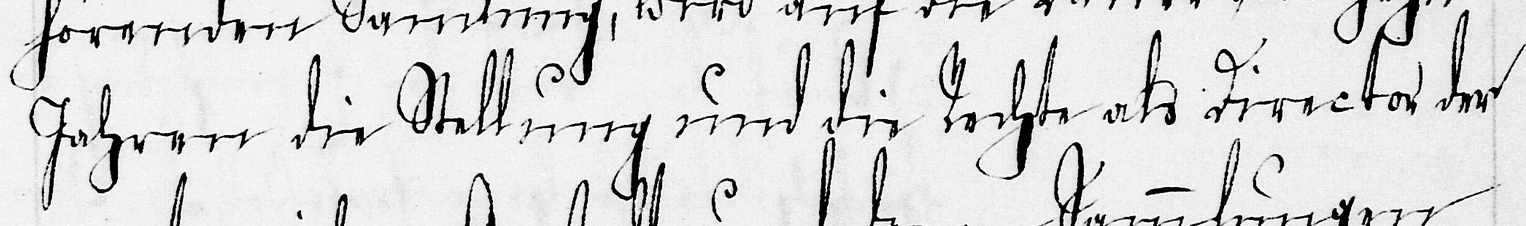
Jahren die Stellung und die Rechte als Director der
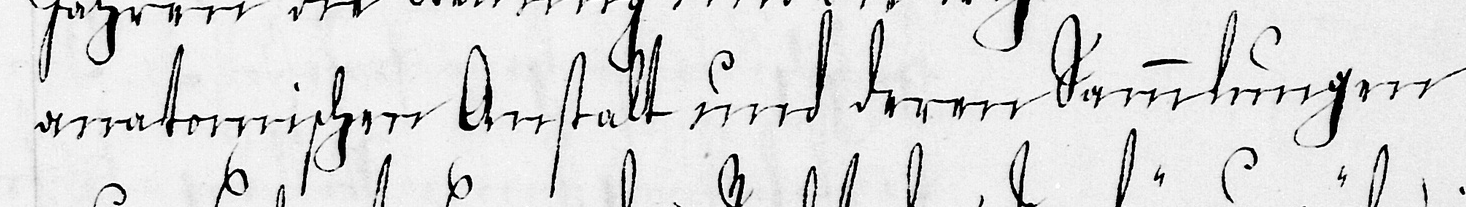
anatomischen Anstalt und deren Sammlungen
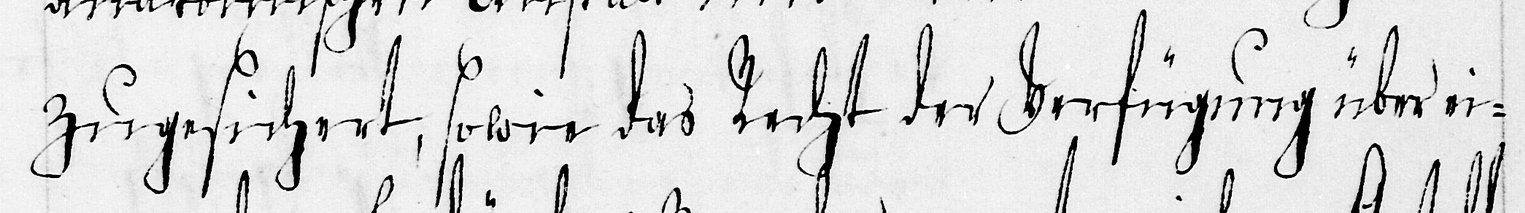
zugesichert, sowie das Recht der Verfügung über ei¬
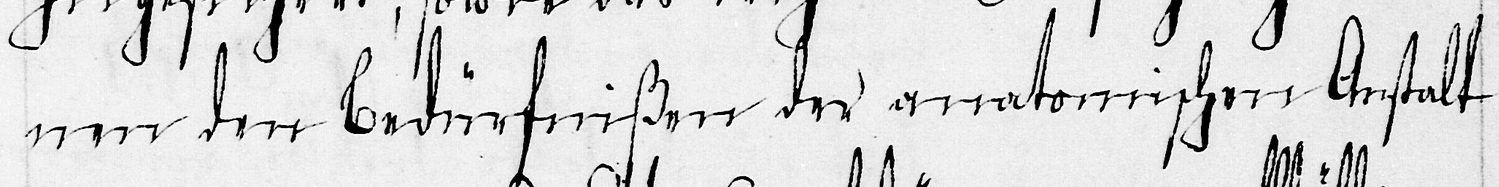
nen den Bedürfnißen der anatomischen Anstalt
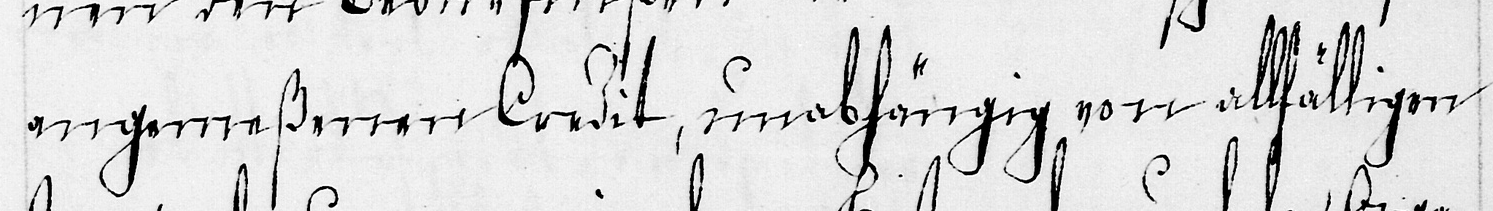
angemeßenen Credit, unabhängig von allfälligen
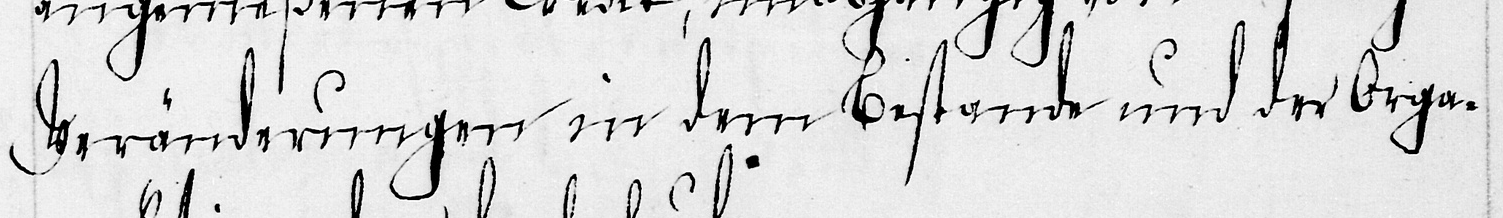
Veränderungen in dem Bestande und der Orga¬
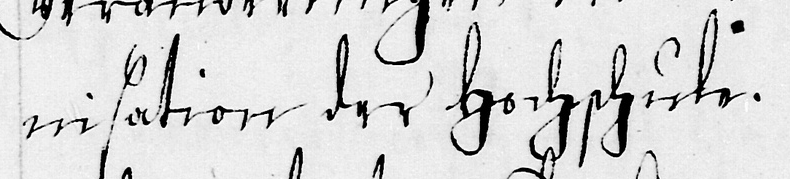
nisation der Hochschule.
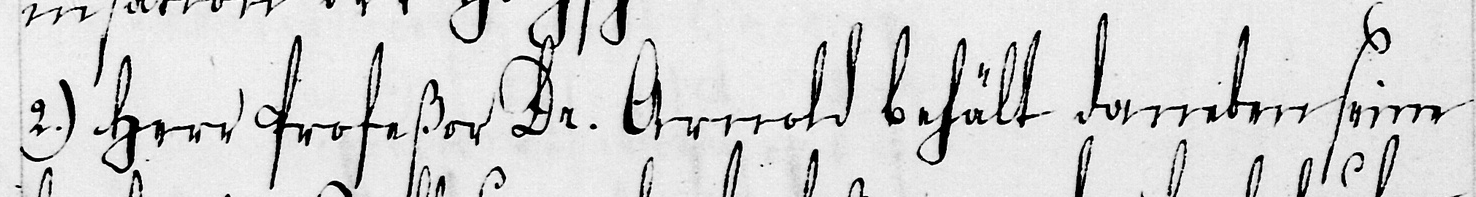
2.) Herr Profeßor Dr. Arnold behält daneben seine
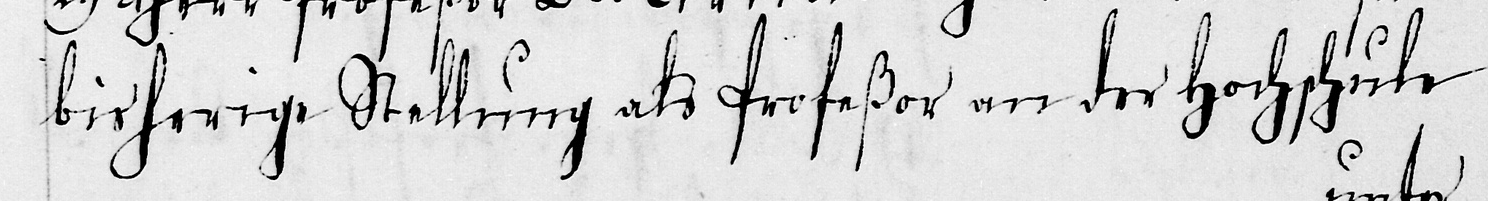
bisherige Stellung als Profeßor an der Hochschule
